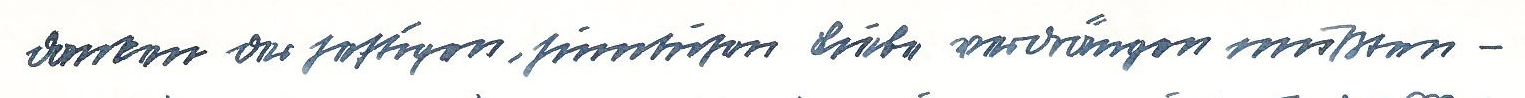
danken der heftigen, sinnlichen Liebe verdrängen mußten –
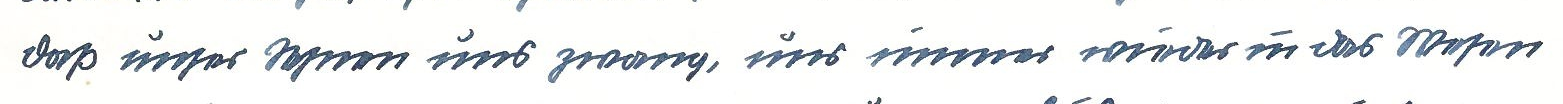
daß unser Sehnen uns zwang, uns immer wieder in das Wesen
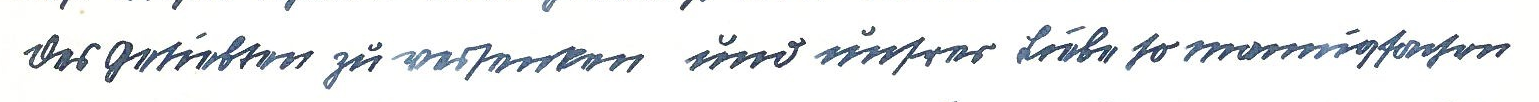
des Geliebten zu versenken und unsrer Liebe so mannigfachen
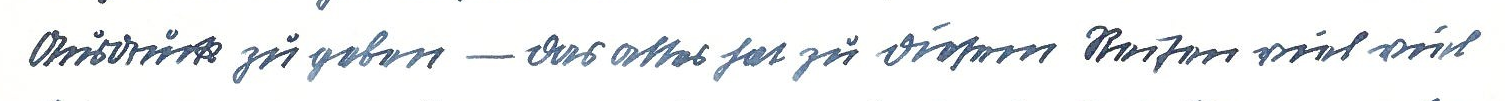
Ausdruck zu geben – das alles hat zu diesem Reifen viel viel
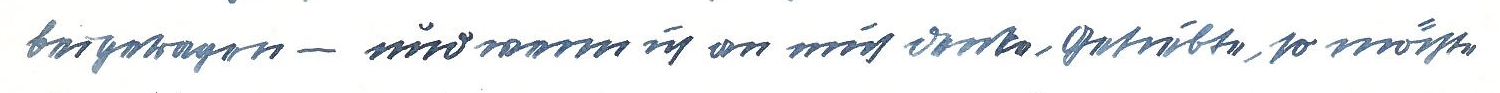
beigetragen — und wenn ich an mich denke, Geliebte, so möchte
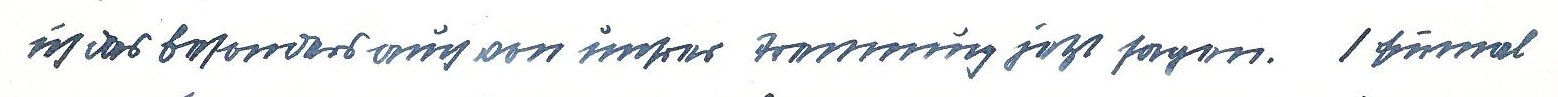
ich das besonders auch von unsrer Trennung jetzt sagen. / Einmal
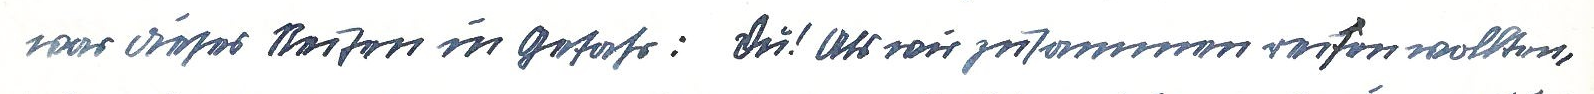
war dieses Reifen in Gefahr: Du! Als wir zusammen reisen wollten,
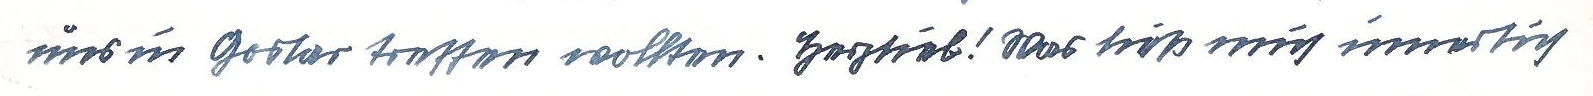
uns in Goslar treffen wollten. Herzlieb! Was ließ mich innerlich
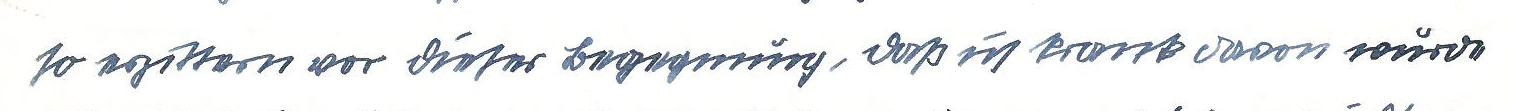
so erzittern vor dieser Begegnung, daß ich krank davon wurde
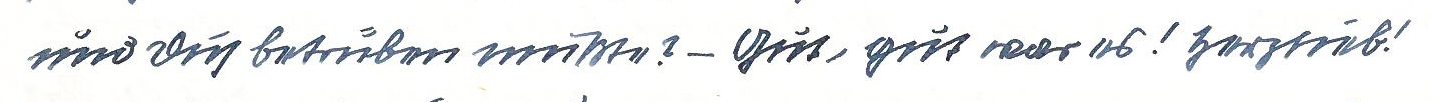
und Dich betrüben mußte? – Gut, gut war es! Herzlieb!
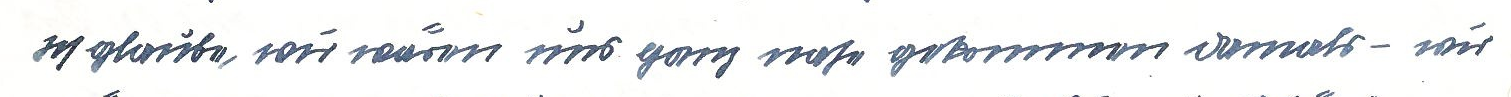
Ich glaube, wir wären uns ganz nahe gekommen damals – wir
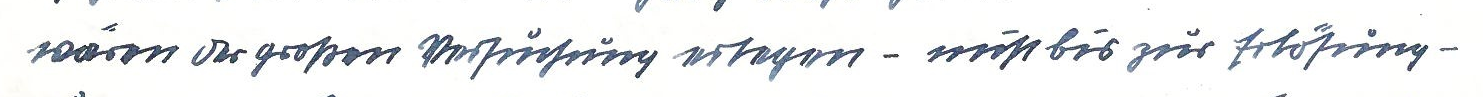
wären der großen Versuchung erlegen – nicht bis zur Erlösung –
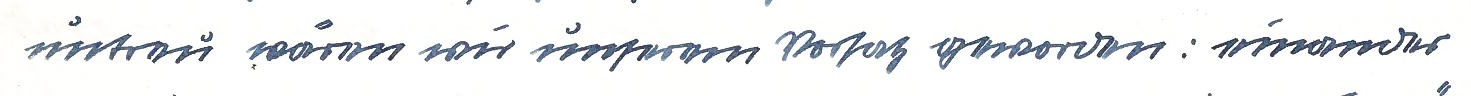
untreu wären wir unserem Vorsatz geworden: einander
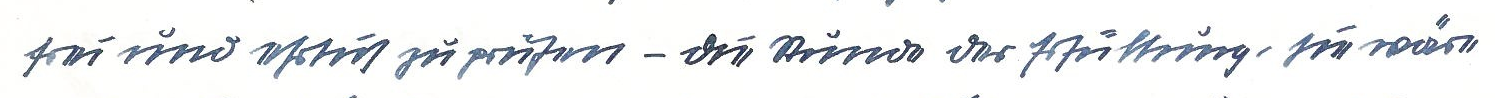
frei und ehrlich zu prüfen – die Stunde der Erfüllung, sie wäre
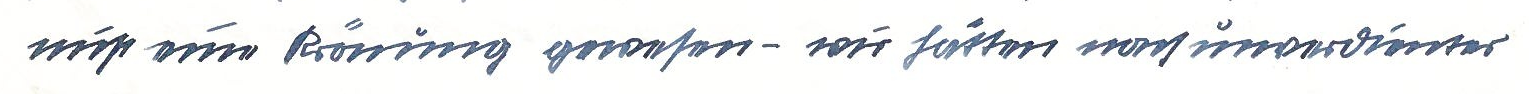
nicht eine Krönung gewesen – wir hätten nach unverdienter
